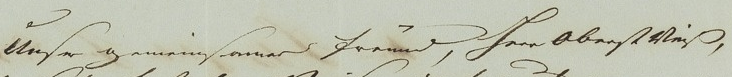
Unser gemeinsamer Freund, Herr Oberst Weiß,
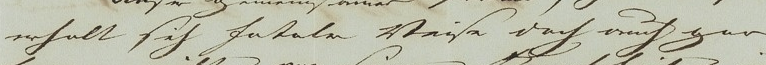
erholt sich fatalr Weise doch auch gar
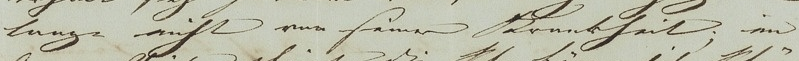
lange nicht von seiner Krankheit; im
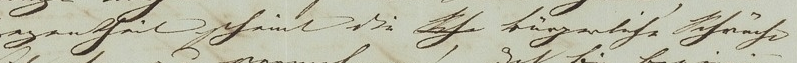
Gegentheil scheint die körperliche Schwäche
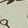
eher zu
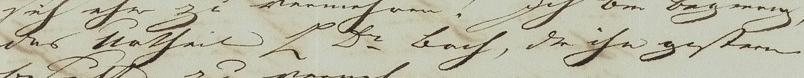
das Urtheil H DrBach, der ihn gestern
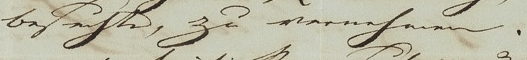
besuchte, zu vernehmen.
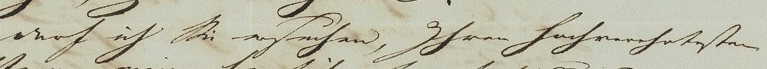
Darf ich Sie ersuchen, Ihren hochverehrtesten
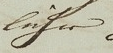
licher
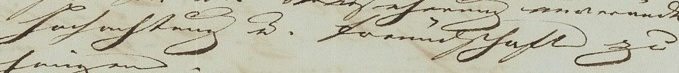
Hochachtung u. Freundschaft zu
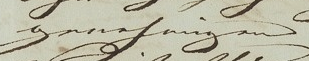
genehmigen.
